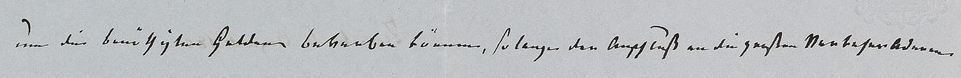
um die benöthigten Gelder bewerben können, so lange der Anschluß an die großen Verkehrs Adern
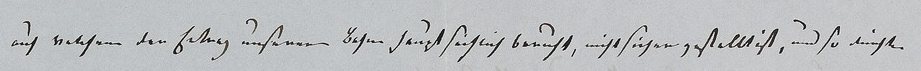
auf welchem der Ertrag unserer Bahn hauptsächlich beruht, nicht sicher gestellt ist, und so dürfte
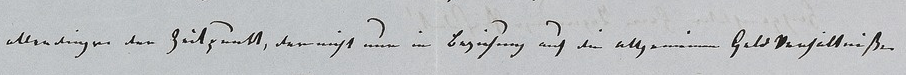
allerdings der Zeitpunkt, der nicht nur in Beziehung auf die allgemeinen Geldverhältniße
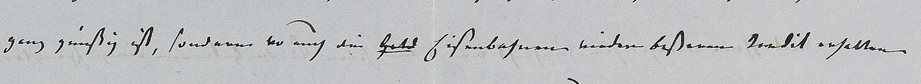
ganz günstig ist, sondern wo auch die Geld Eisenbahnen wieder beßeren Kredit erhalten
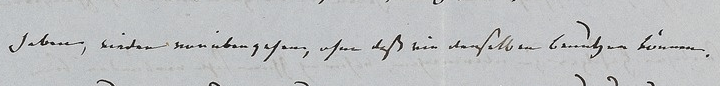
haben, wieder vorübergehen, ohne daß wir denselben benutzen können.
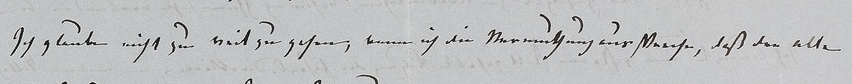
Ich glaube nicht zu weit zu gehen, wenn ich die Vermuthung ausspreche, daß der alte
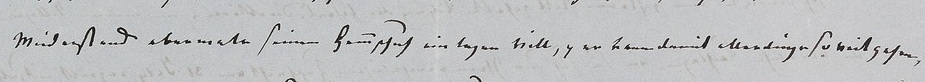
Wiederstand abermals seinen Hemmschuh einlegen will, & es kann damit allerdings so weit gehen,
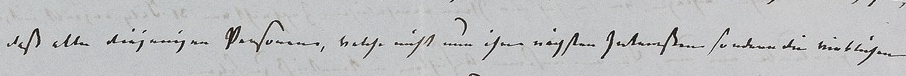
daß alle diejenigen Personen, welche nicht nur ihre nächsten Intereßen, sondern die wirklichen
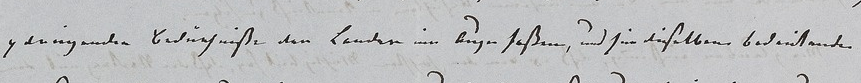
& dringenden Bedürfniße des Landes ins Auge faßen, und für dieselben bedeutende
